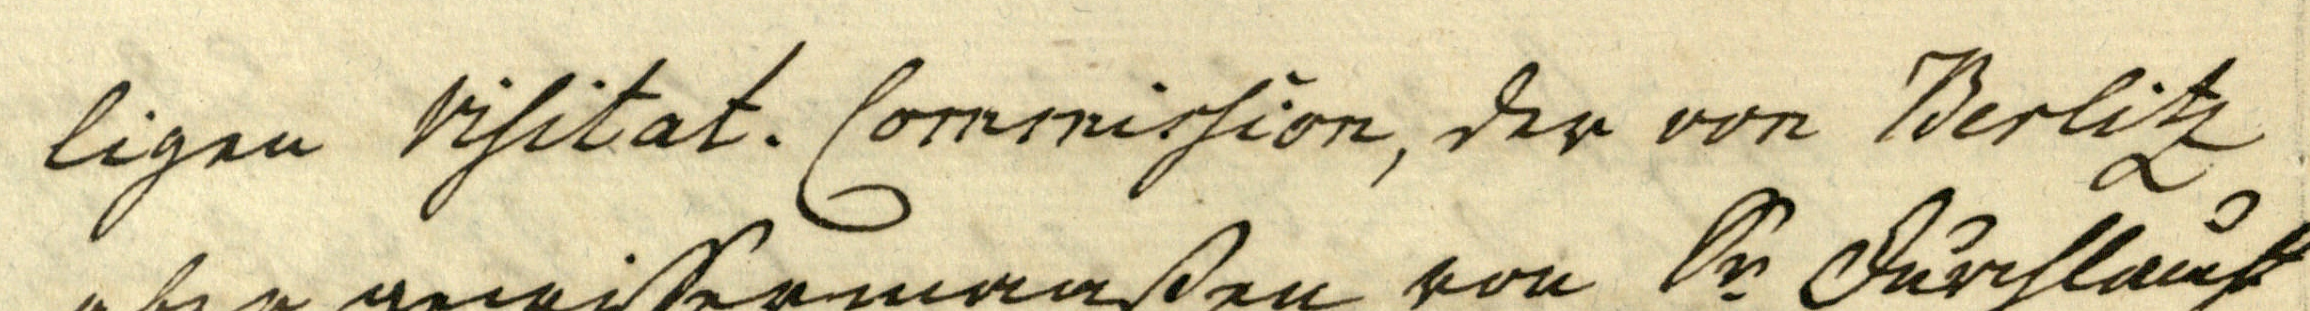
ligen Visitat. Commission, der von Berlitz
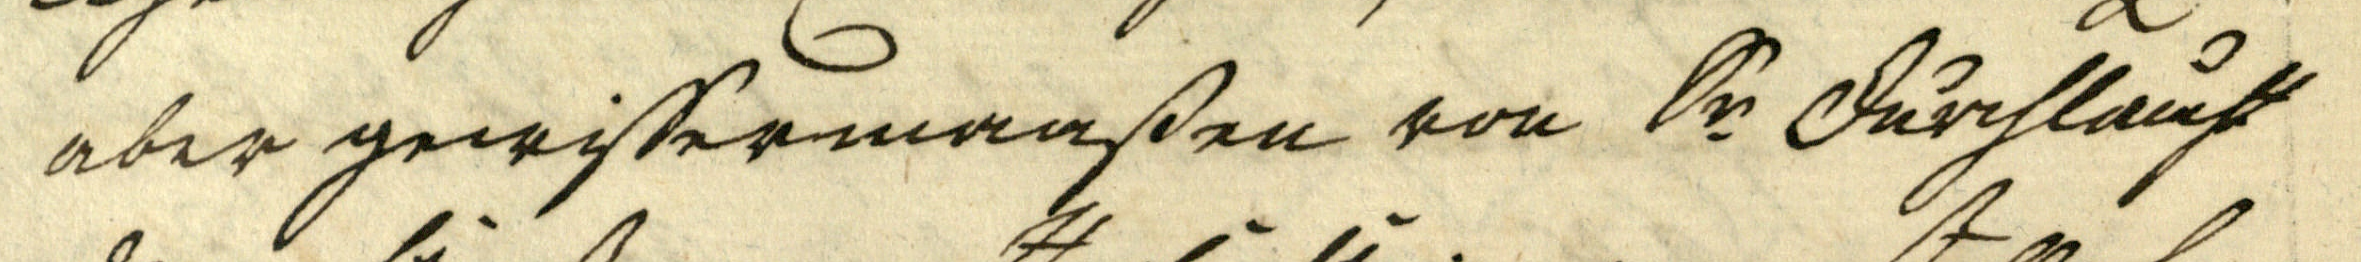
aber gewissermmaßen von Sr Durchlaucht
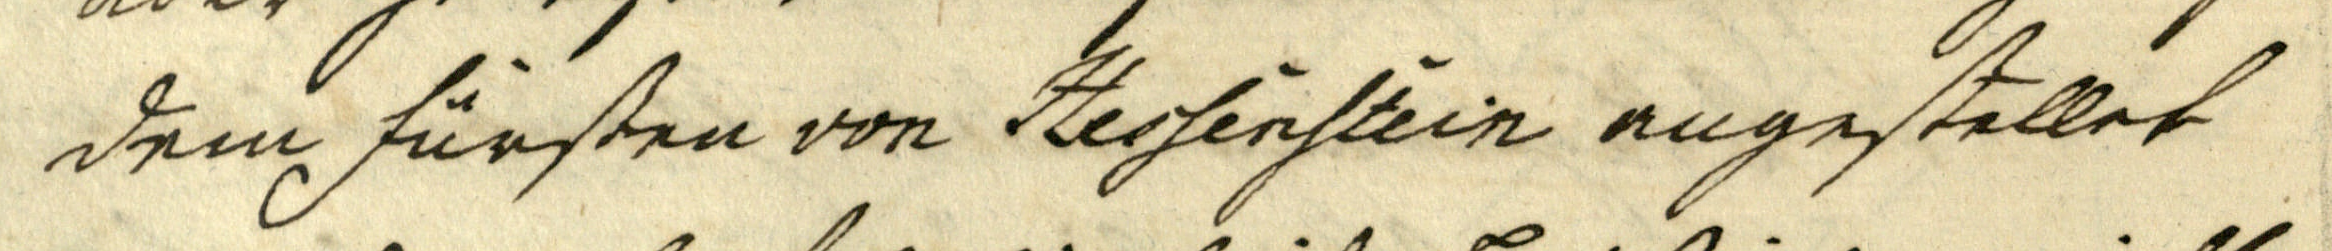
dem Fürsten von Hessensein angestellet
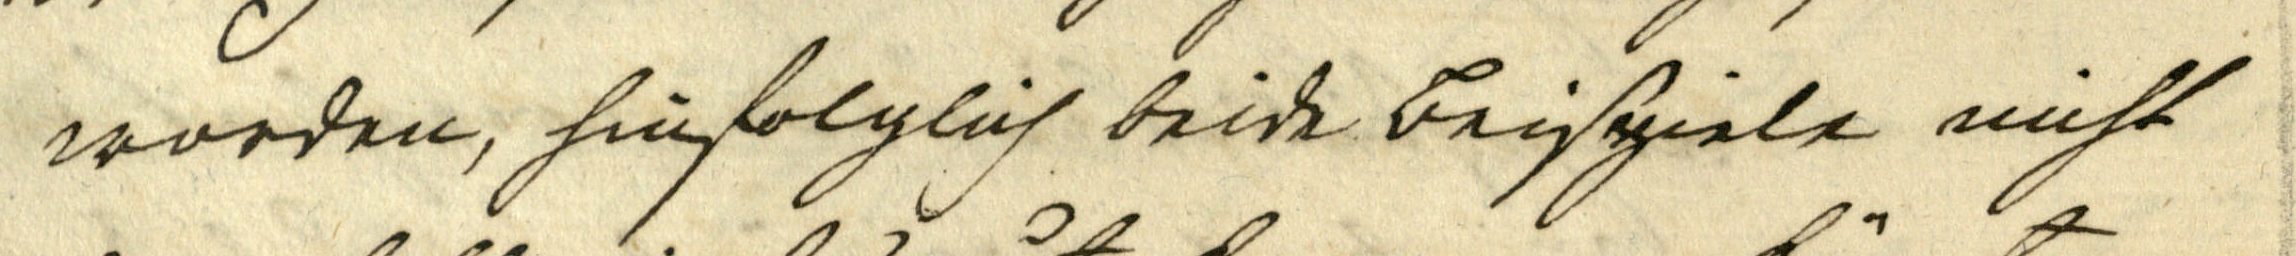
worden, hinfolglich beide Beispiele nicht
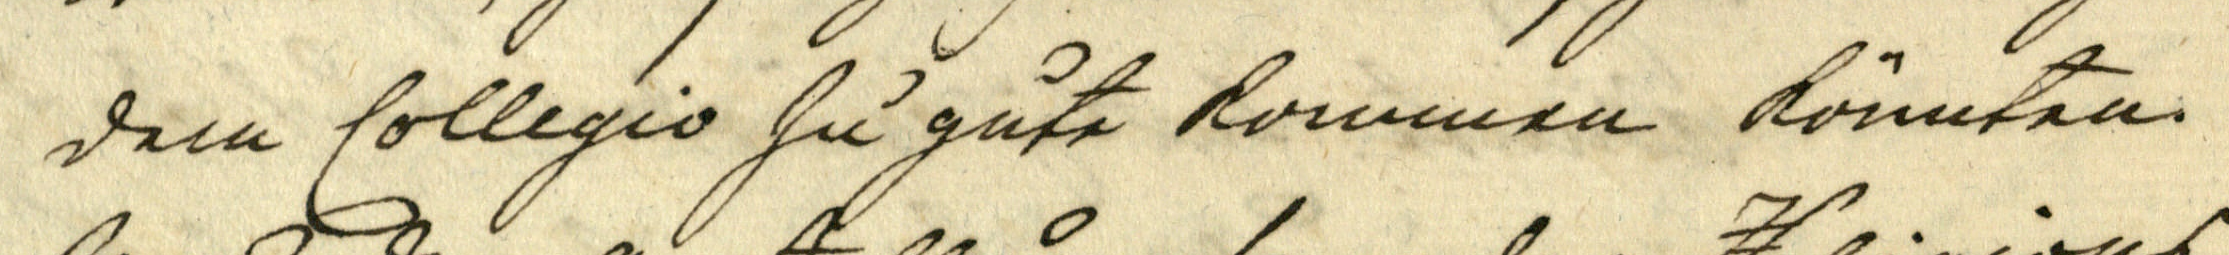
dem Collegio zu gute kommen könnten.
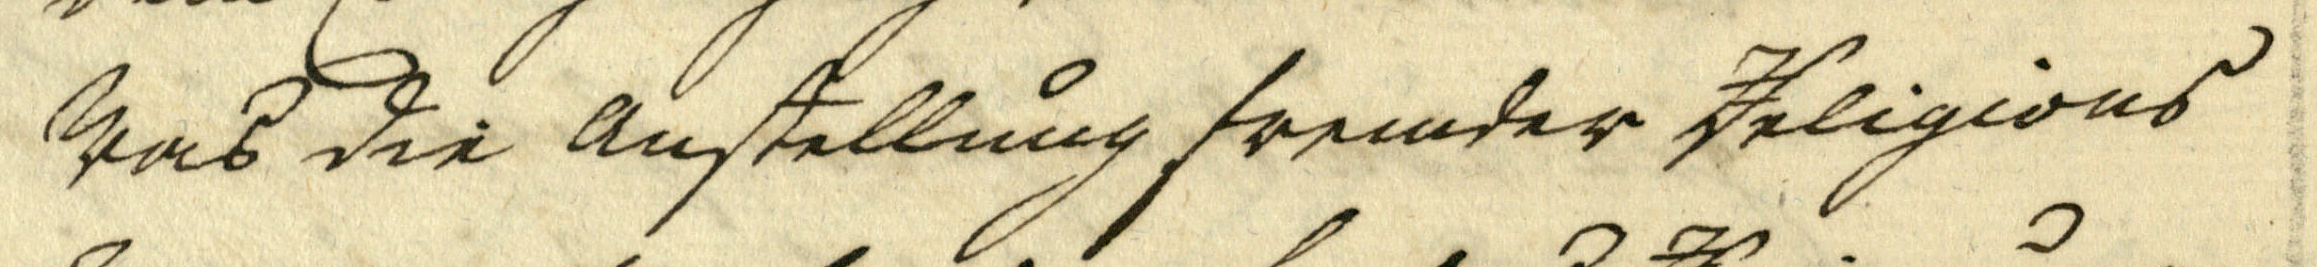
Was die Anstellung fremder Religions
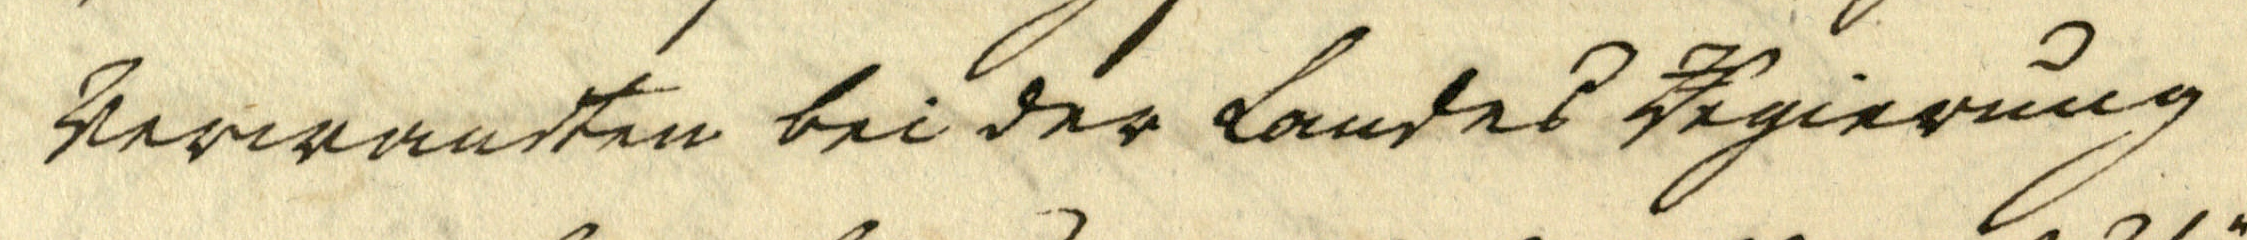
Verwandten bei der Landes Regierung
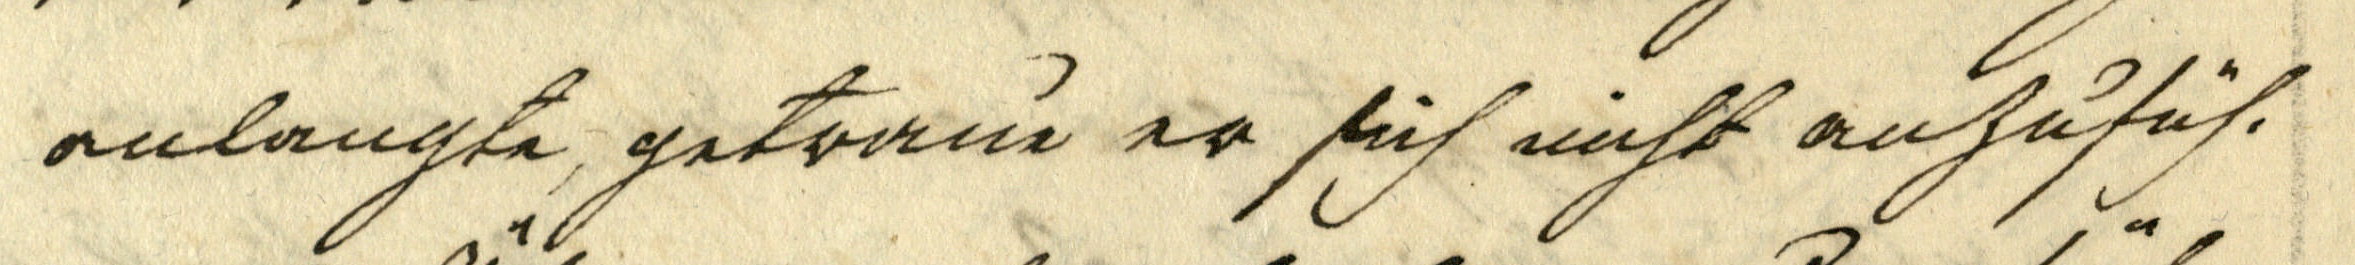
anlangte, getraue er sich nicht anzufüh¬
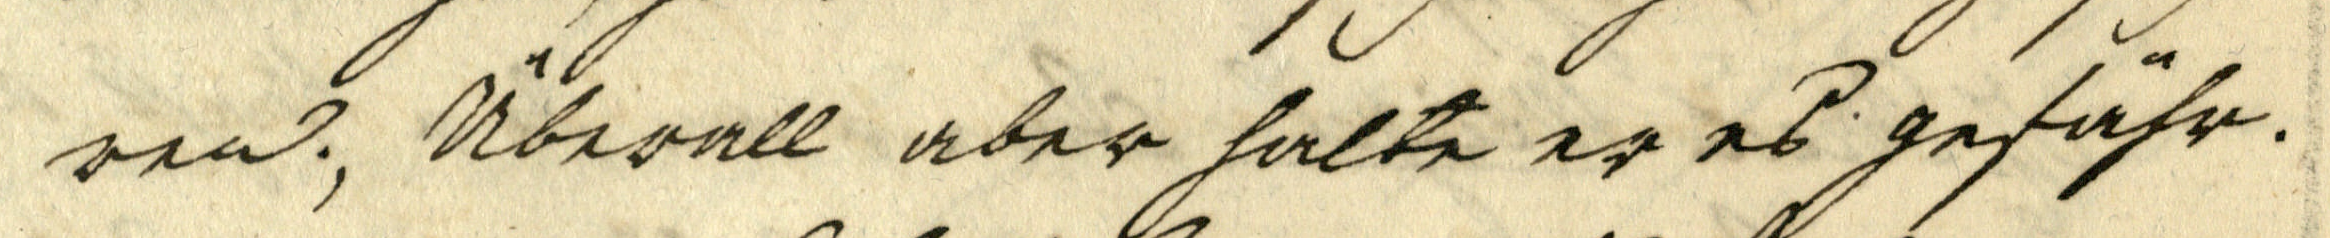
ren; Überall aber halte er es gefähr¬
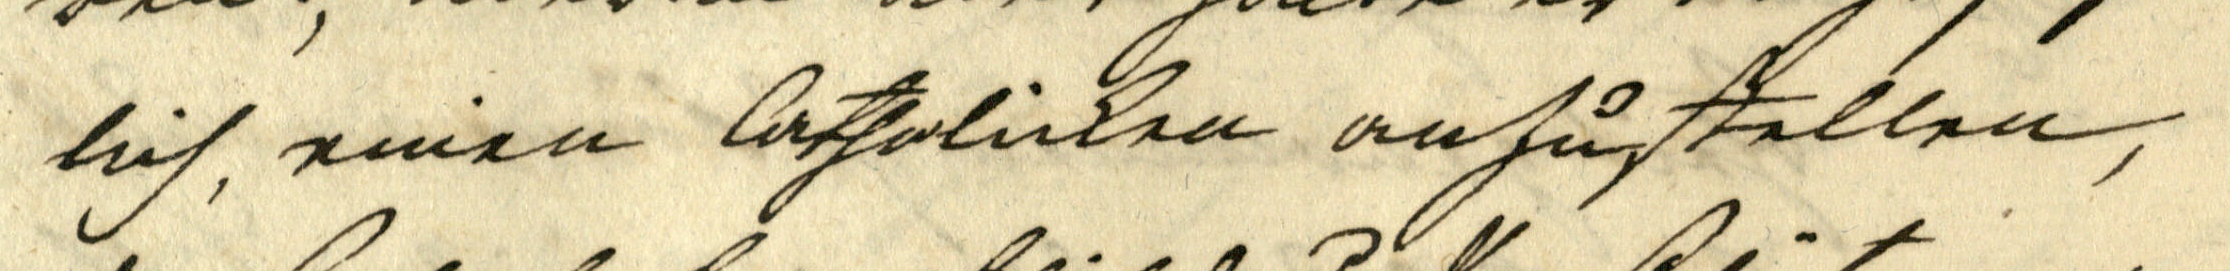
lich, einen Catholicken anzustellen,
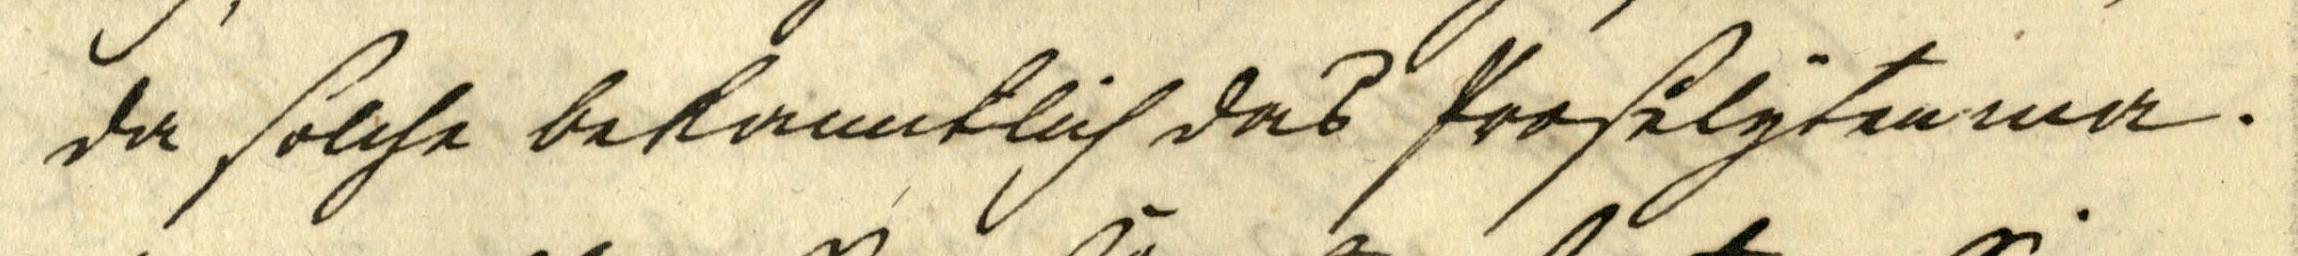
da solche bekanntlich das Proselytenma¬
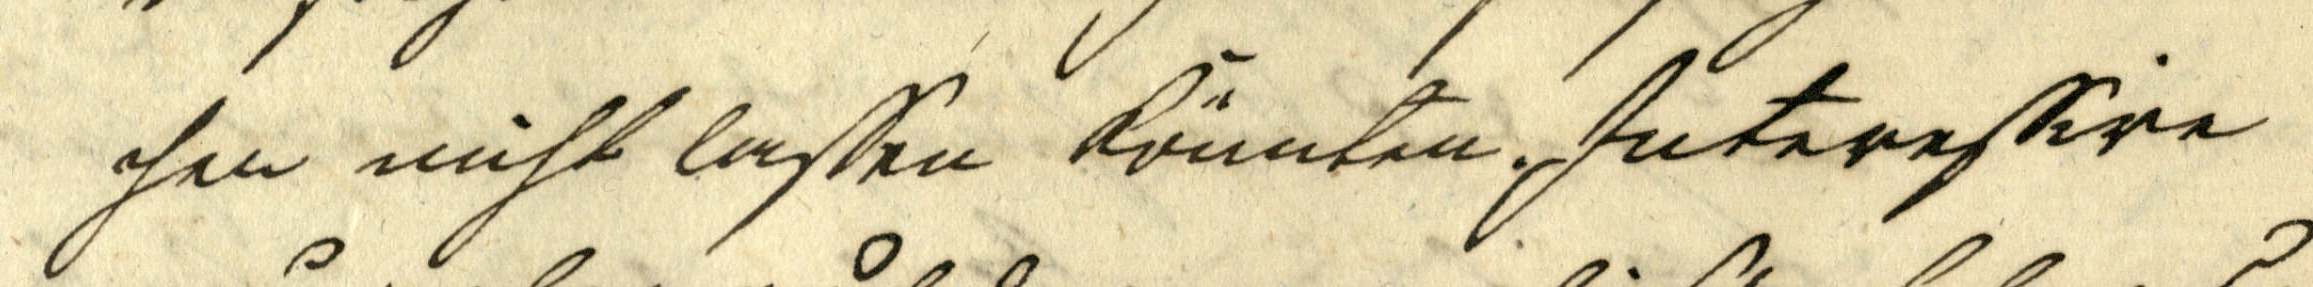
chen nicht lassen könnten. Interessire
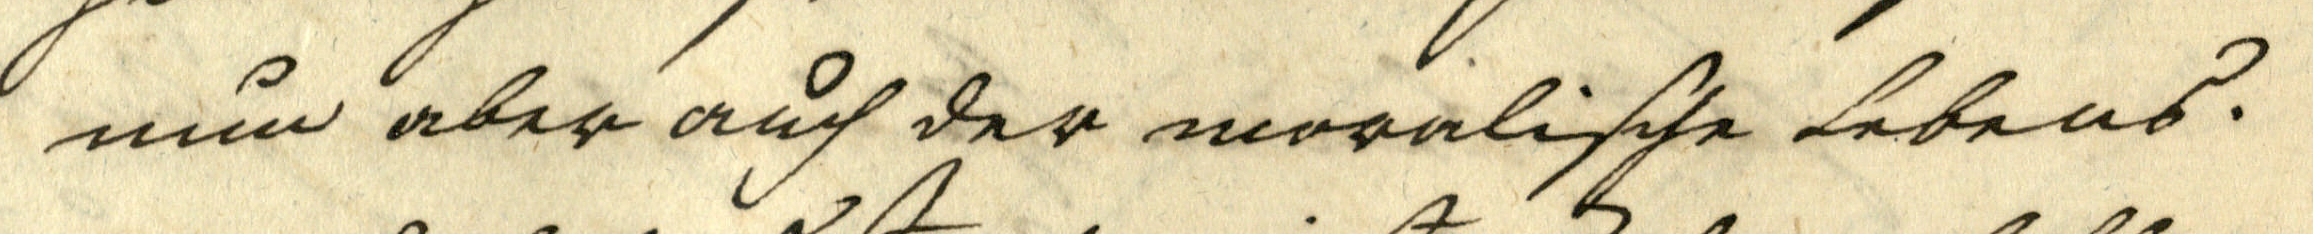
nun aber auch der moralische Lebens¬
